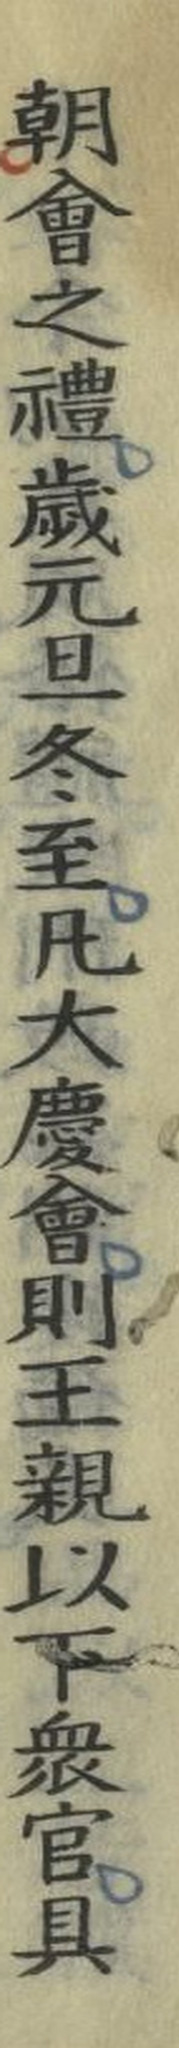朝會之禮。歲元旦冬至。凡大慶會。則王親以下衆官。具
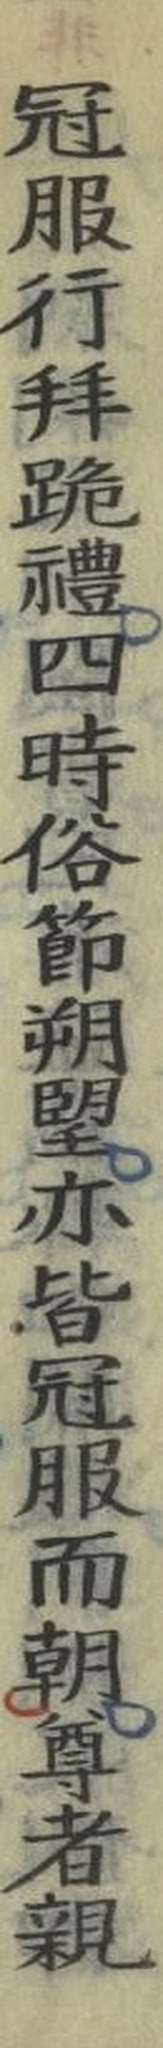冠服行拜跪禮。四時俗節朔朢。亦皆冠服而朝。尊者親
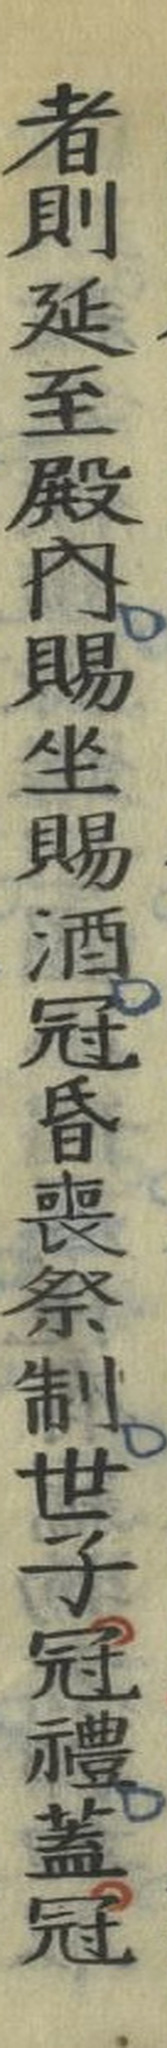者則延至殿内。賜坐賜酒。冠昏喪祭制。世子冠禮。蓋冠
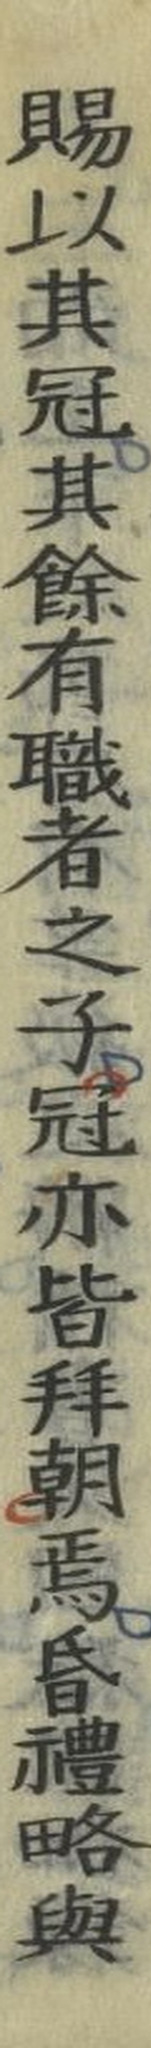賜以其冠。其餘有職者之子。冠亦皆拜朝焉。昏禮略與
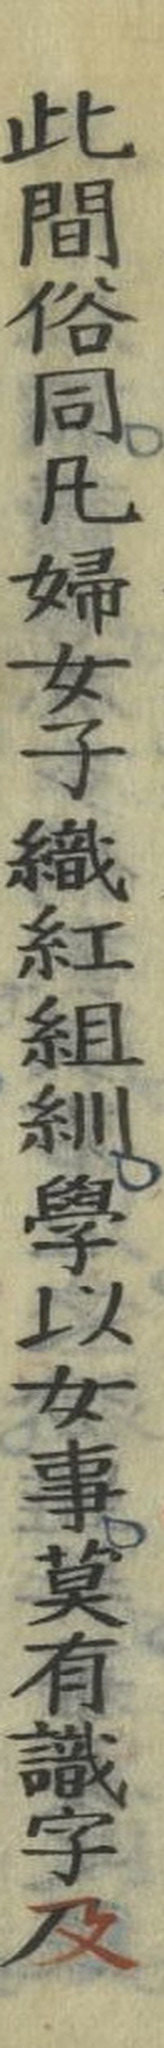此間俗同。凡婦女子織紅組紃。學以女事。莫有識字及
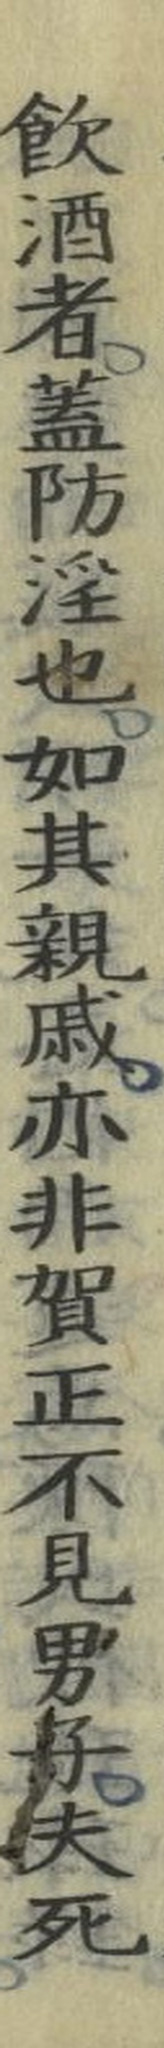飮酒者。蓋防淫也。如其親戚。亦非賀正不見男子。夫死
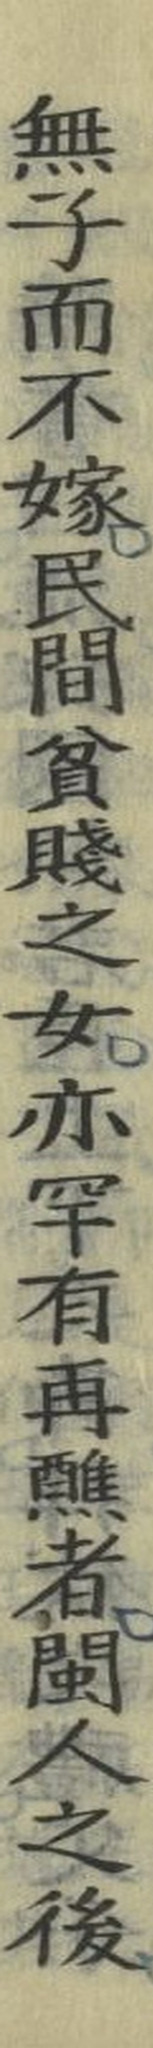無子而不嫁。民間貧賤之女。亦罕有再醮者。閩人之後。
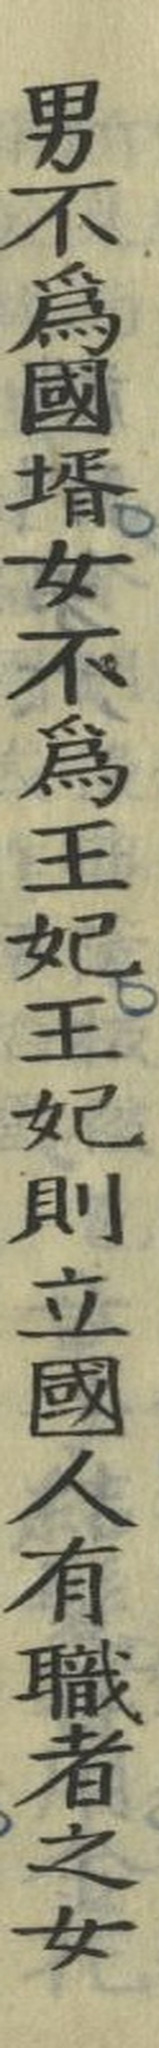男不爲國壻。女不爲王妃。王妃則立國人有職者之女
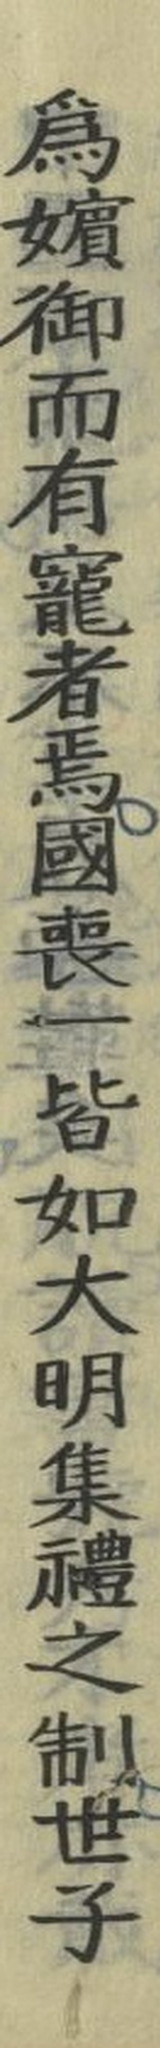爲嬪御而有寵者焉。國喪一皆如大明集禮之制。世子
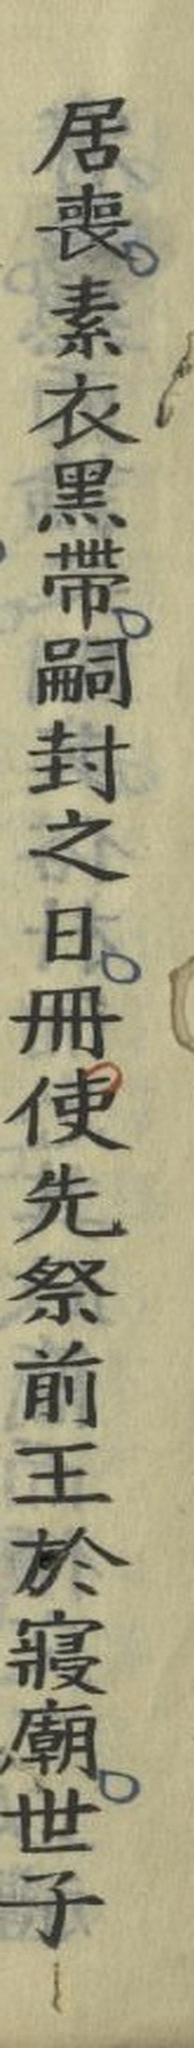居喪。素衣黑帶。嗣封之日。冊使先祭前王於寢廟。世子
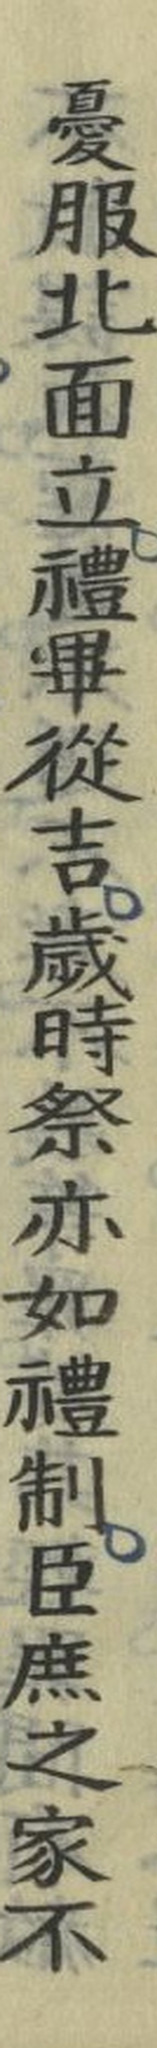憂服北面立。禮畢從吉。歲時祭亦如禮制。臣庶之家不
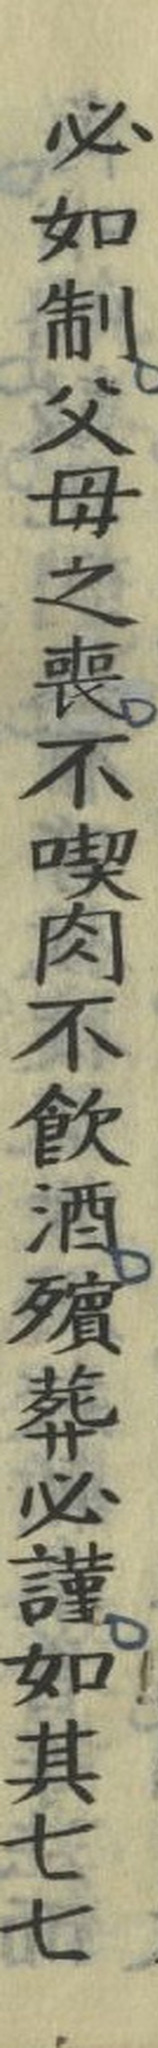必如制。父母之喪。不喫肉不飮酒。殯葬必謹。如其七七
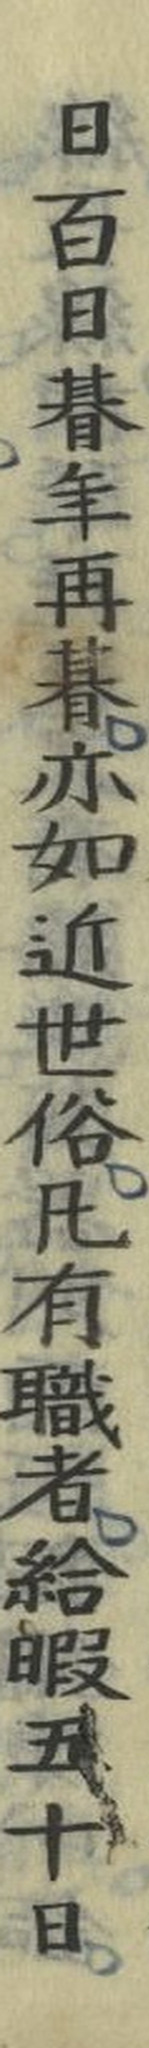日百日朞年再朞。亦如近世俗。凡有職者。給暇五十日。
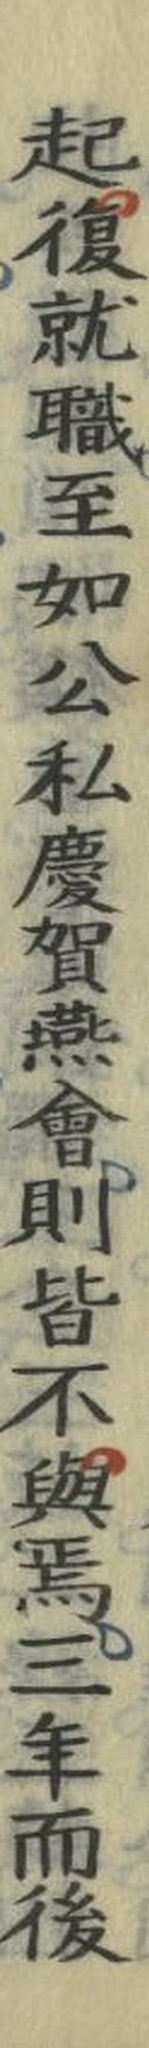起復就職。至如公私慶賀燕會。則皆不與焉。三年而後

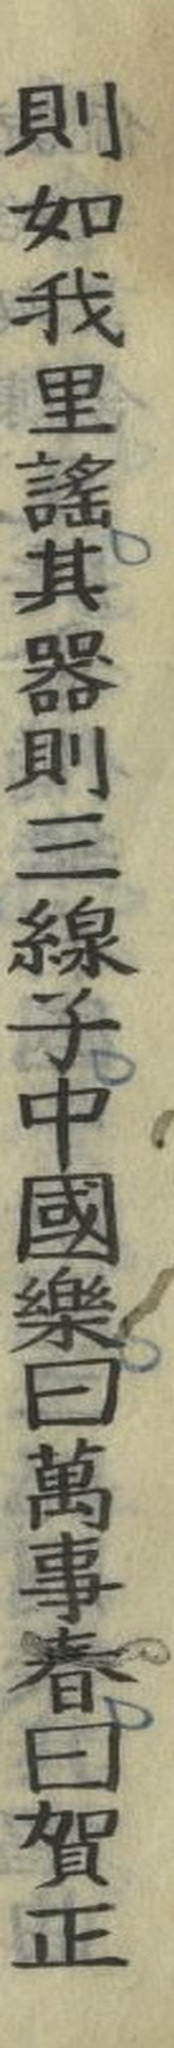則如我里謠。其器則三線子。中國樂。曰萬事春。曰賀正
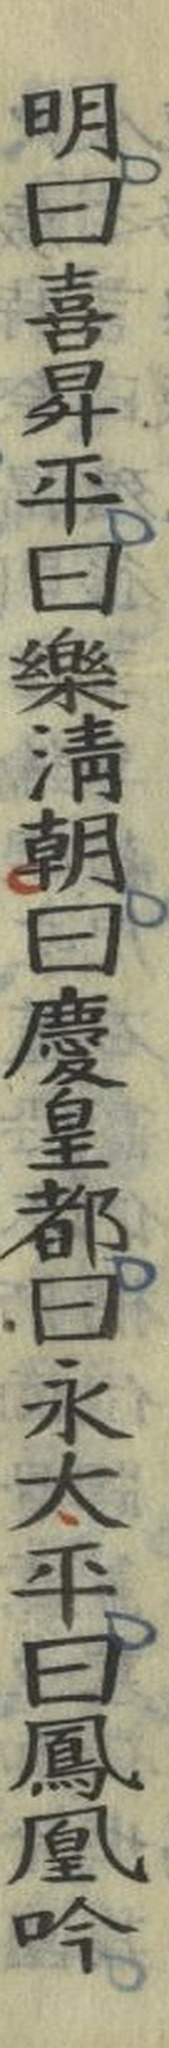明。曰喜昇平。曰樂淸朝。曰慶皇都。曰永太平。曰鳳凰吟。
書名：南島志
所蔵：University of the Ryukyus Library
